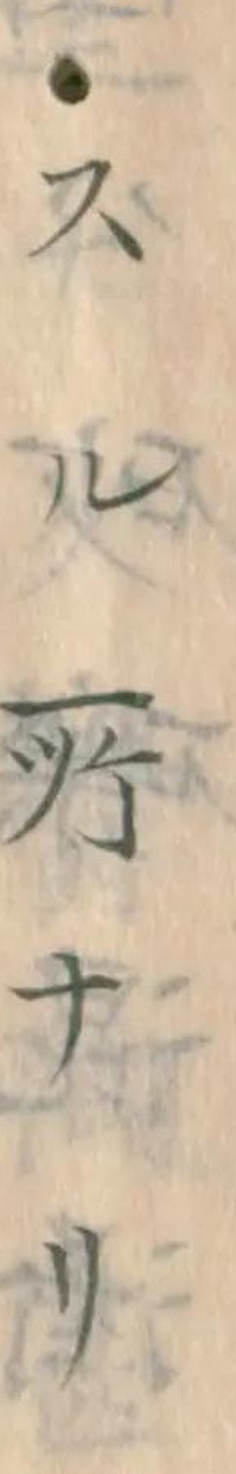スル所ナリ
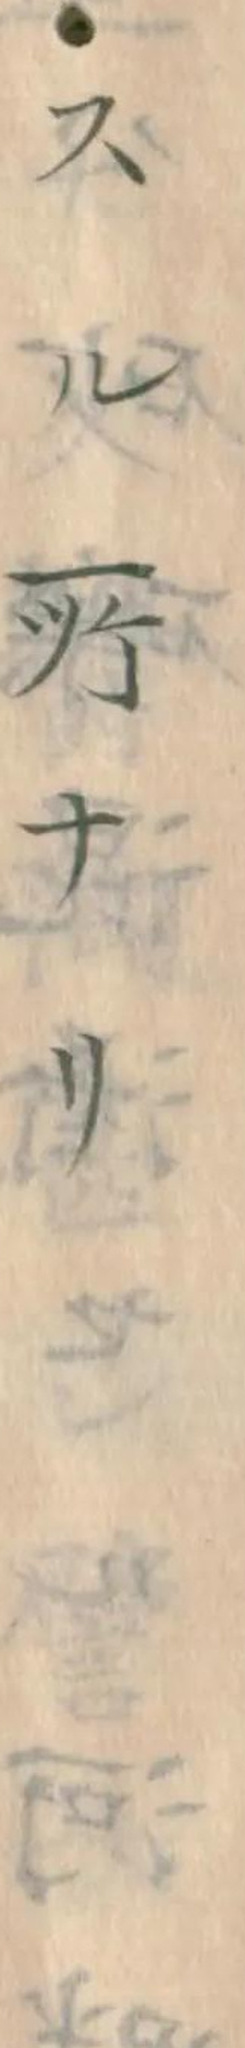スル所ナリ
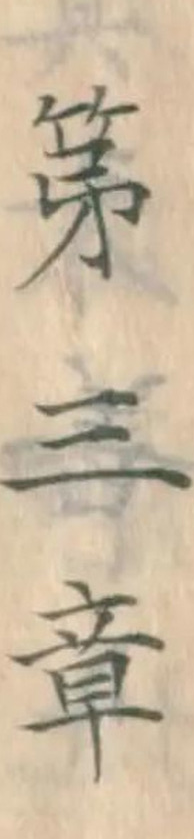第三章
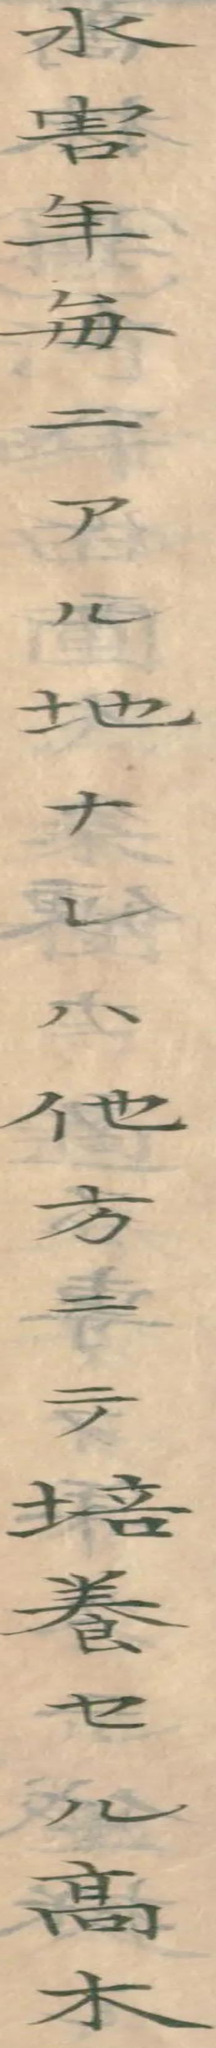水害年毎ニアル地ナレハ他方ニテ培養セル高木

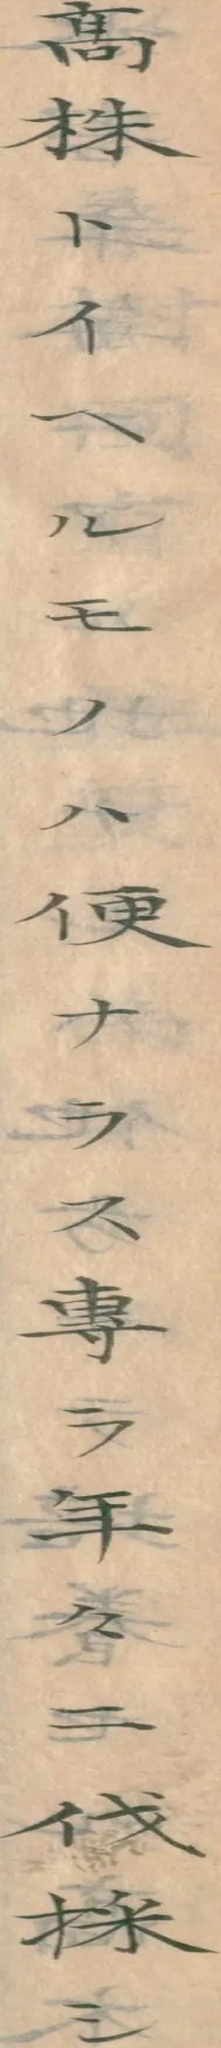高株トイヘルモノハ便ナラス専ラ年々ニ伐採シ
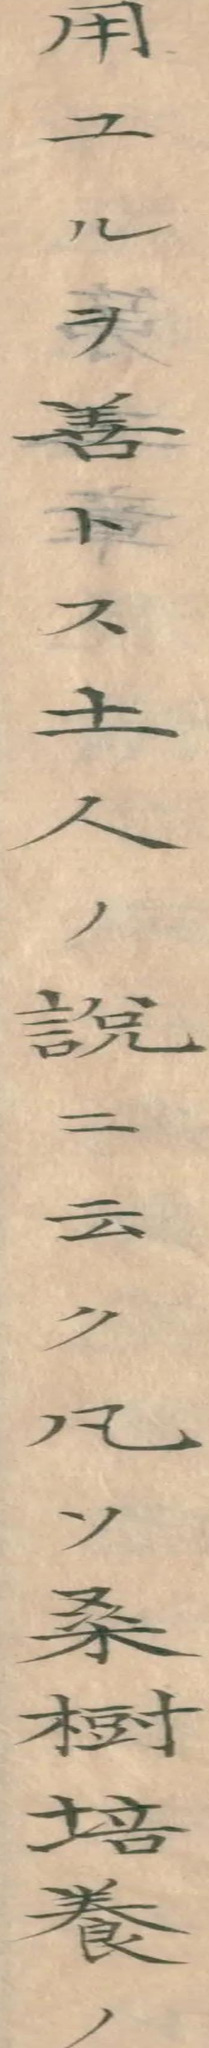用ユルヲ善トス土人ノ説ニ云ク凡ソ桑樹培養ノ
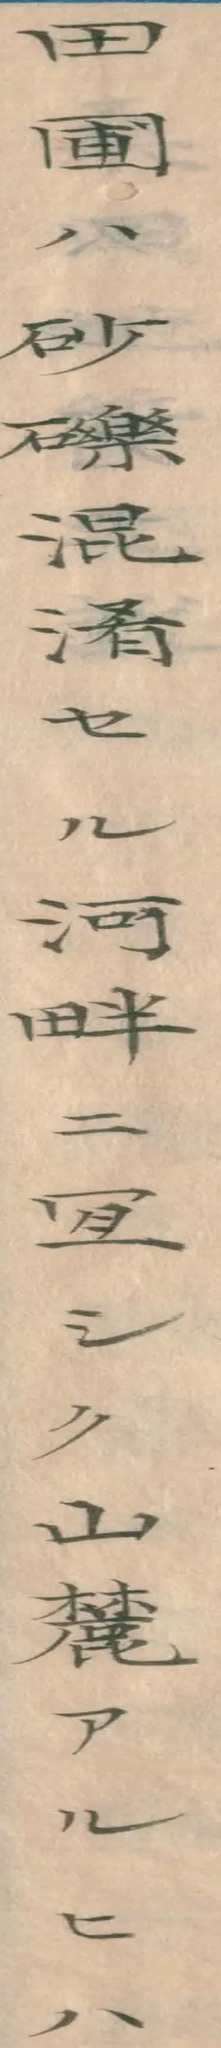田圃ハ砂礫混淆セル河畔ニ宜シク山麓アルヒハ
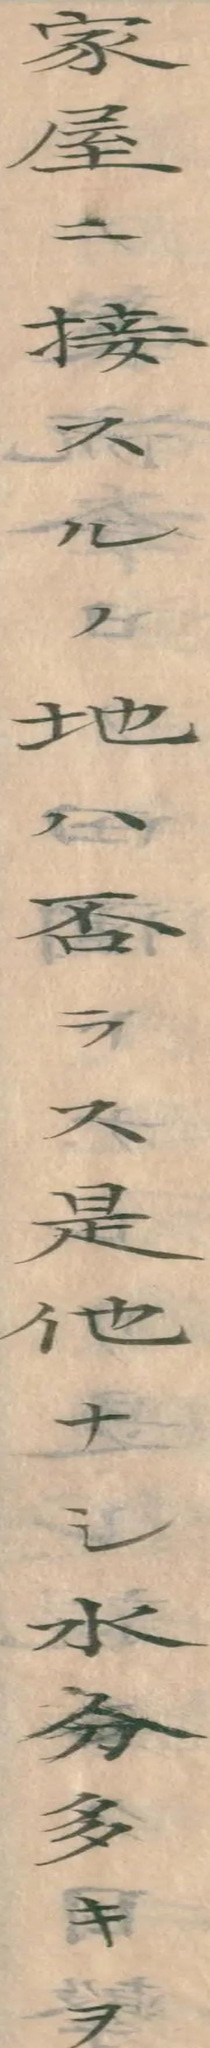家屋ニ接スルノ地ハ否ラス是他ナシ水分多キヲ
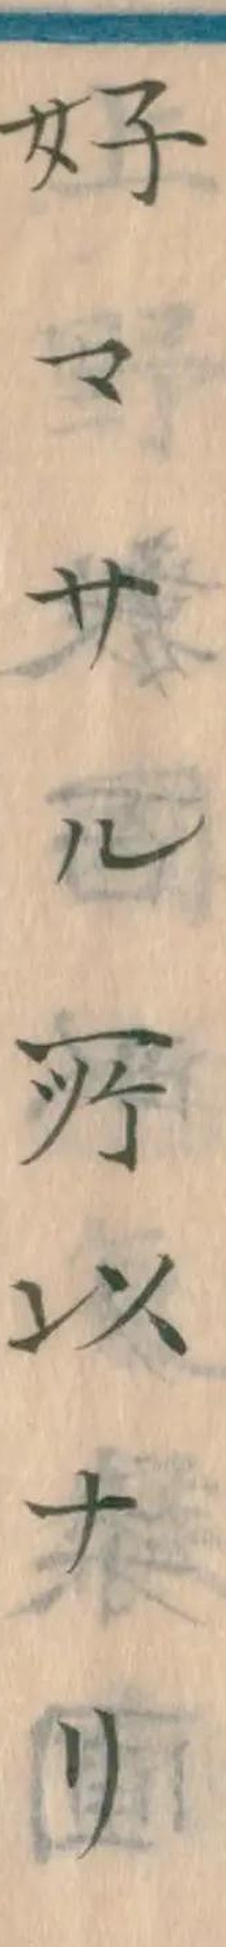好マサル所以ナリ
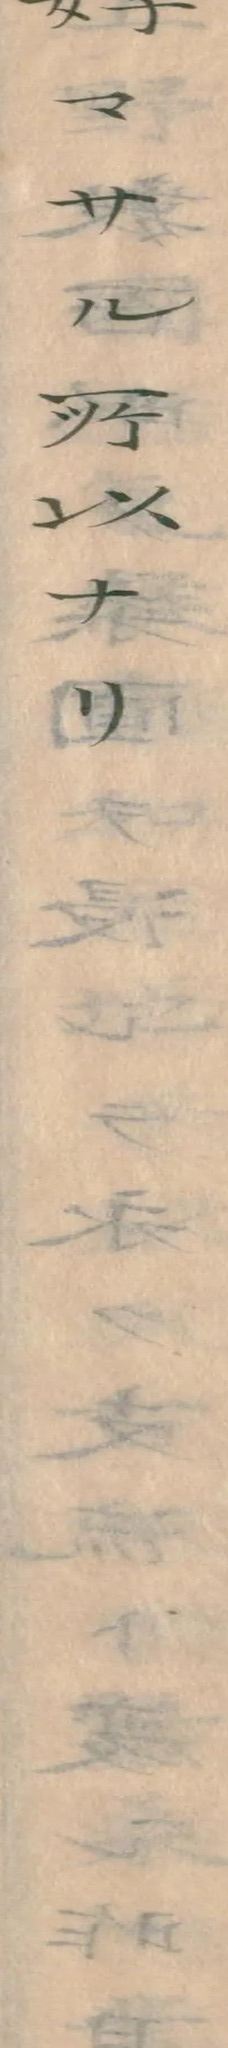好マサル所以ナリ
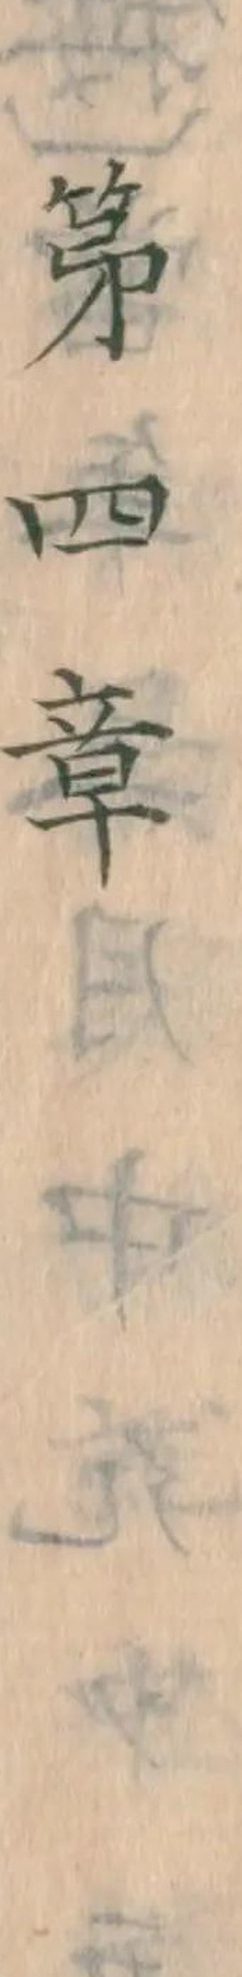第四章
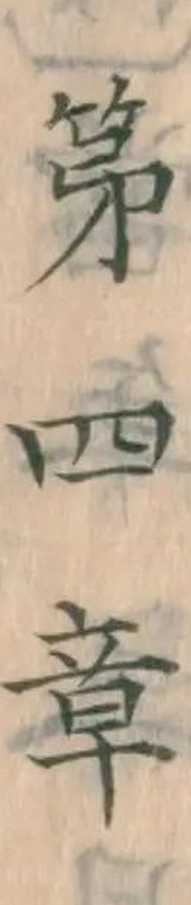第四章
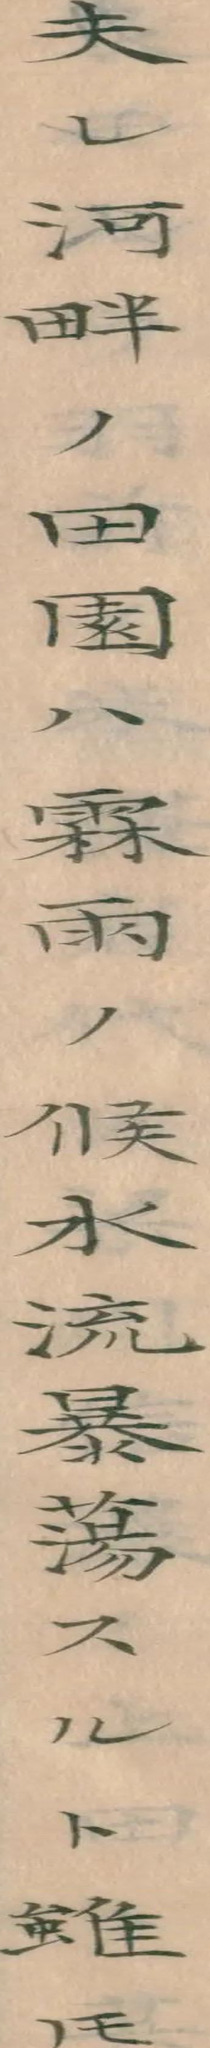夫レ河畔ノ田園ハ霖雨ノ候水流暴蕩スルト雖トモ
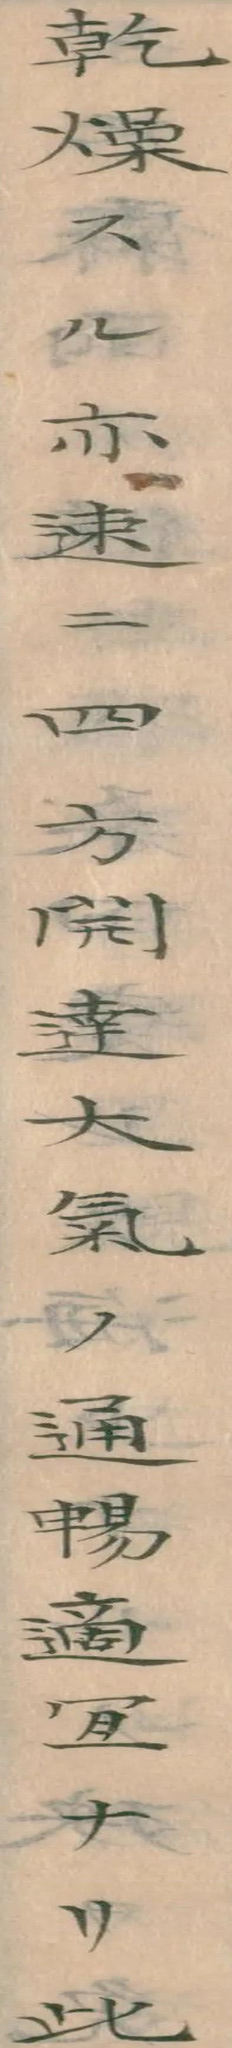乾燥スル亦速ニ四方開達大気ノ通暢適宜ナリ此
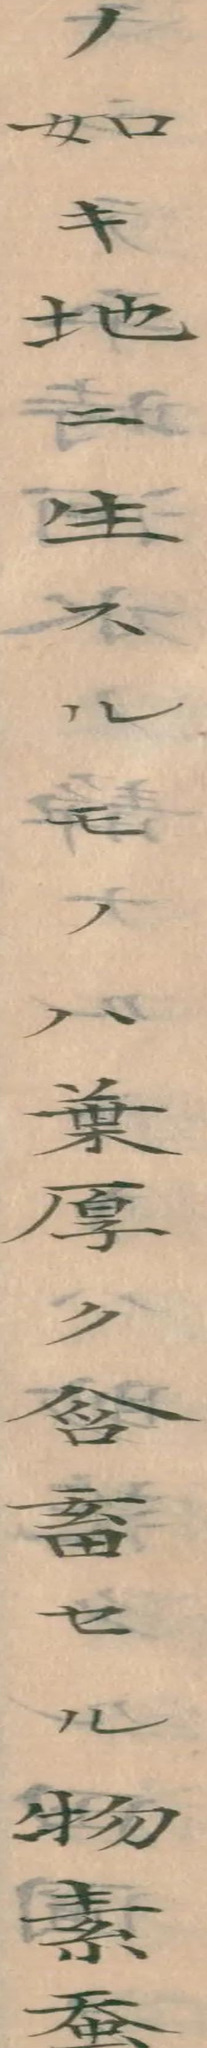ノ如キ地ニ生スルモノハ葉厚ク含畜セル物素蚕
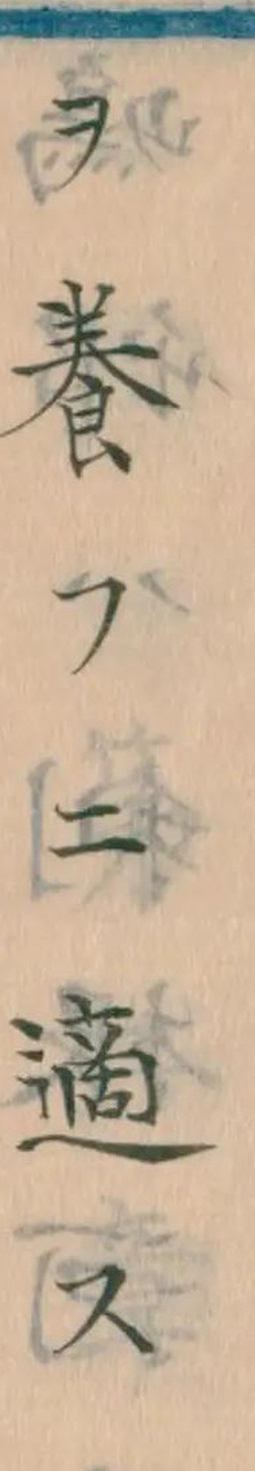ヲ養フニ適ス
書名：蚕桑集成
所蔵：国立国会図書館 National Diet Library, JAPAN
